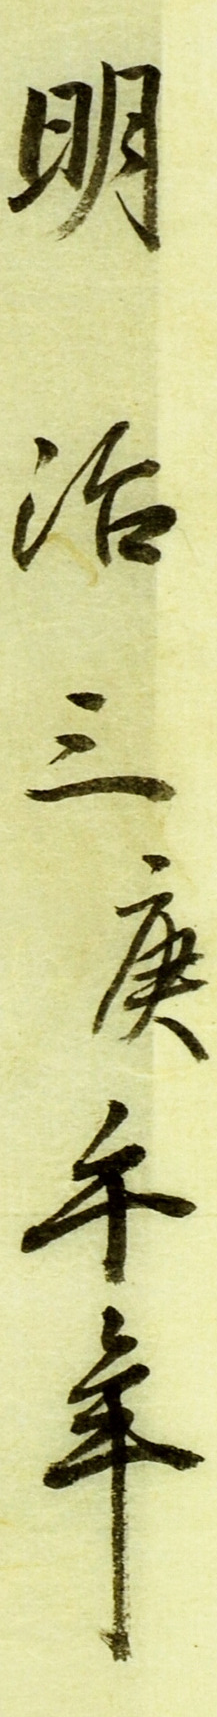明治三庚午年
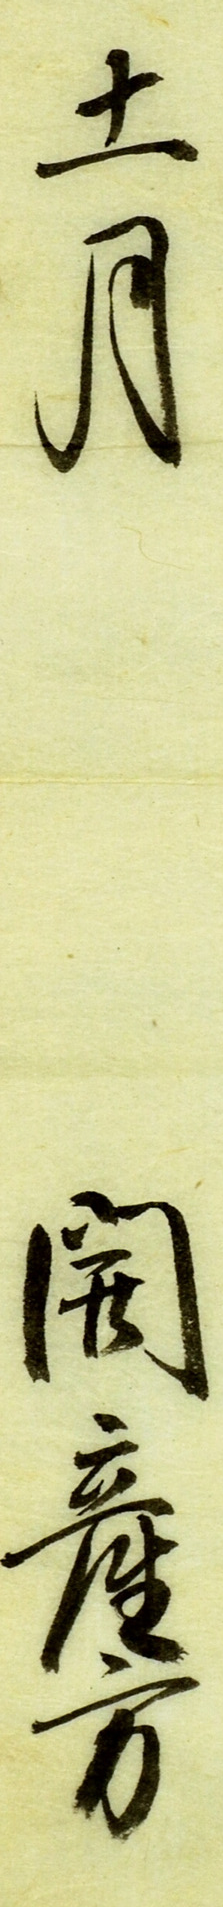十一月開産方
